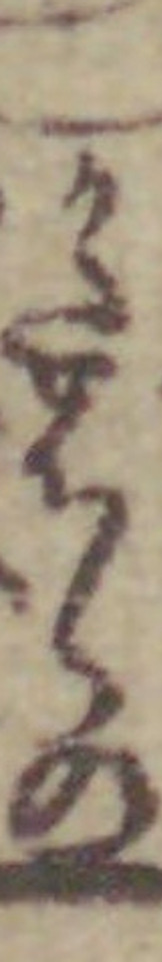かたはらの
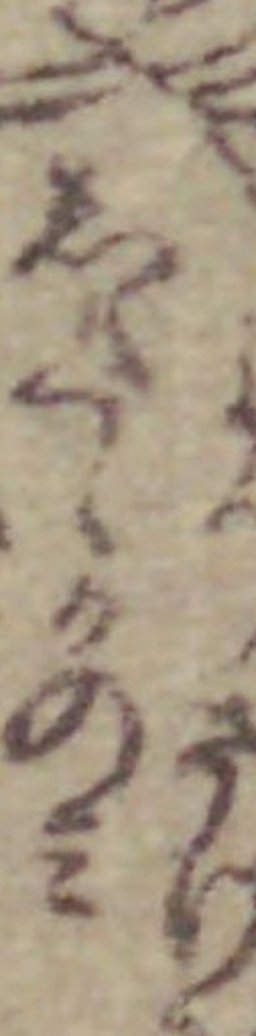したゝかのみ
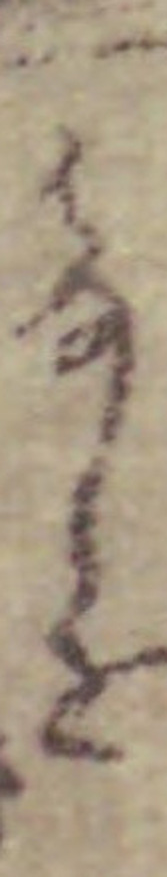はなしを
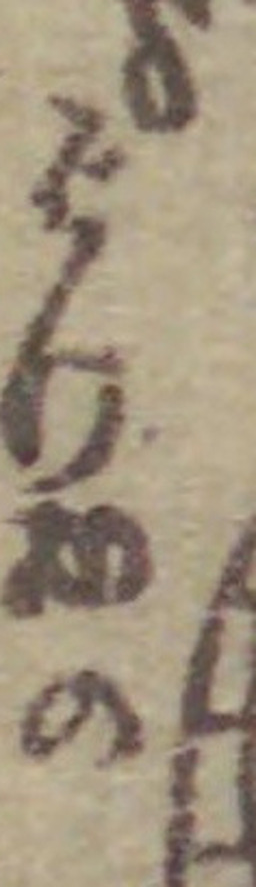ばけ物の

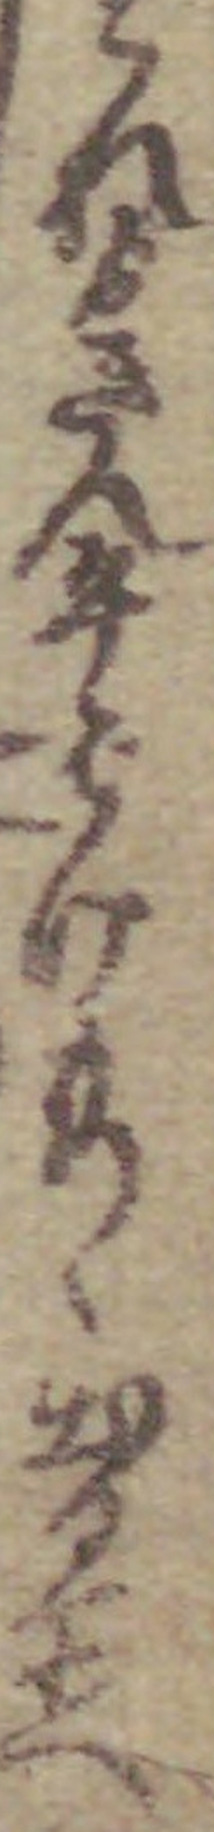それゟきん平ばけものゝ出る所へ
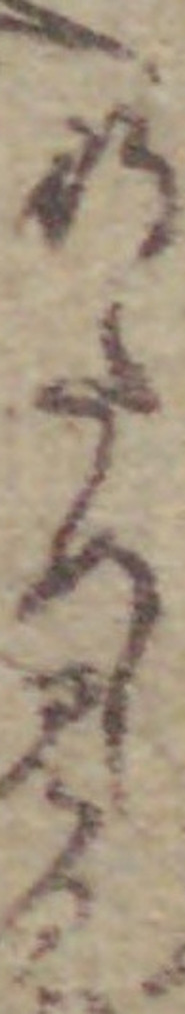行ためし見るに
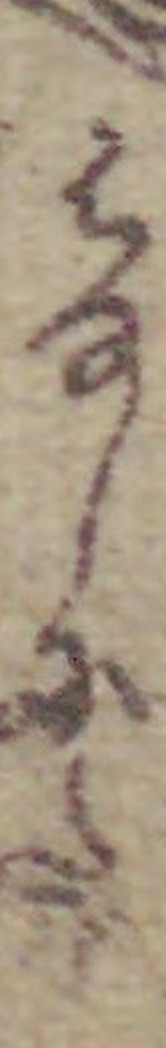はなしにたが
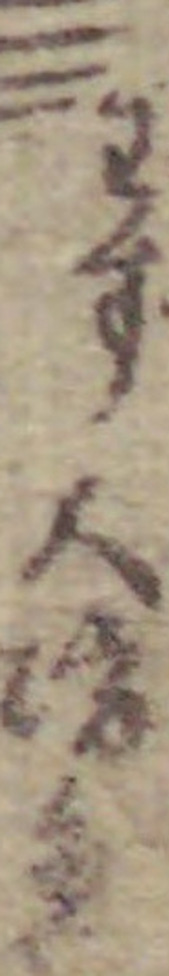わず大坊主
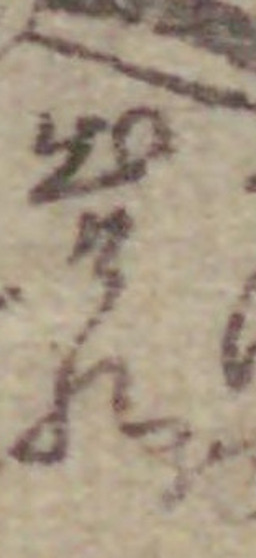出けれ
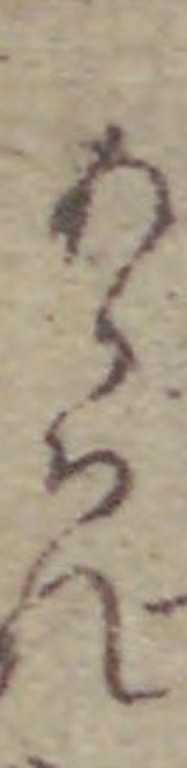あらはれ
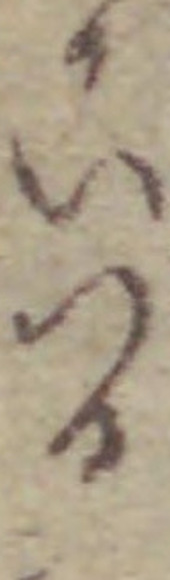いづる

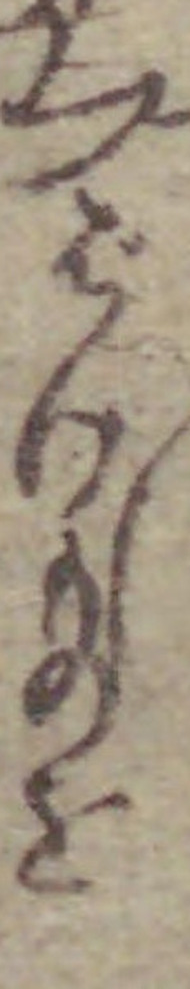ばけものを
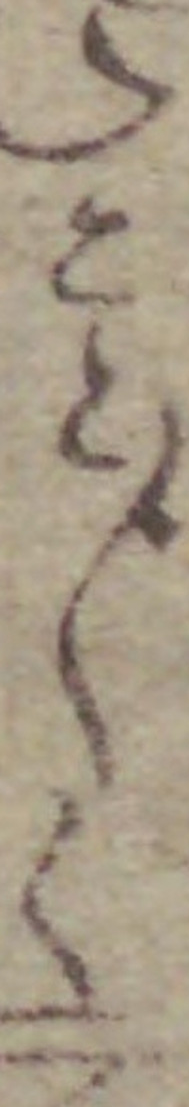こと〴〵く
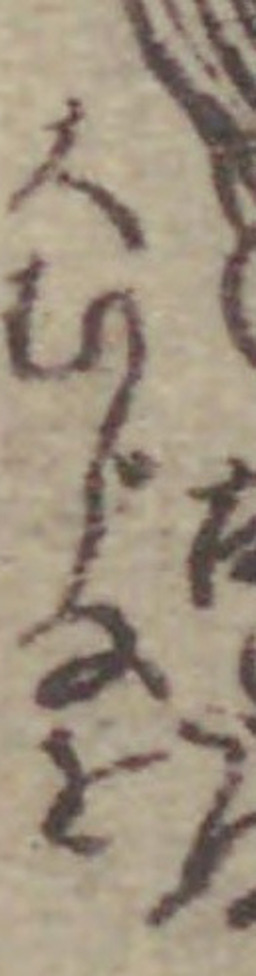大むじなを
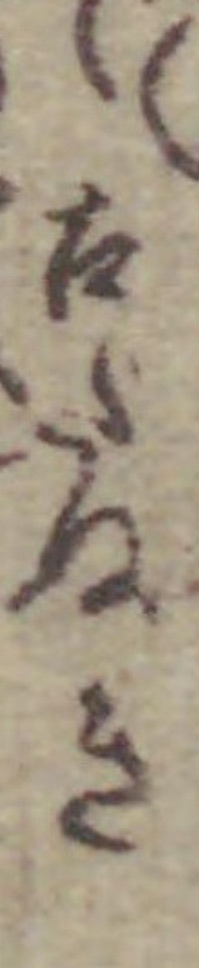古たぬき
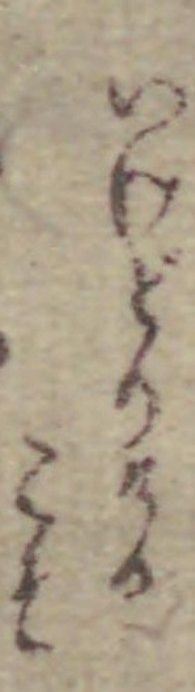いけどりける
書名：妖怪雪濃段 2巻
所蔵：国立国会図書館 National Diet Library, JAPAN
